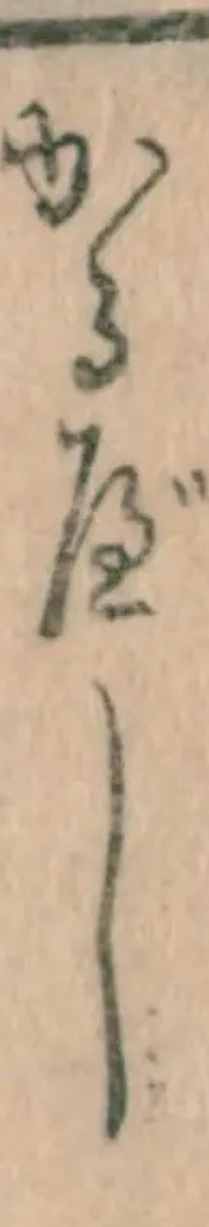かるべし
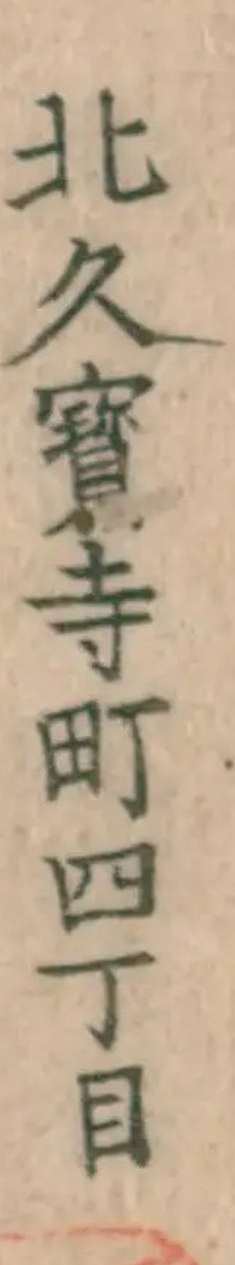北久宝寺町四丁目
